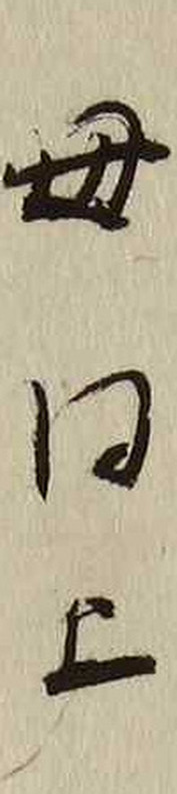母同上
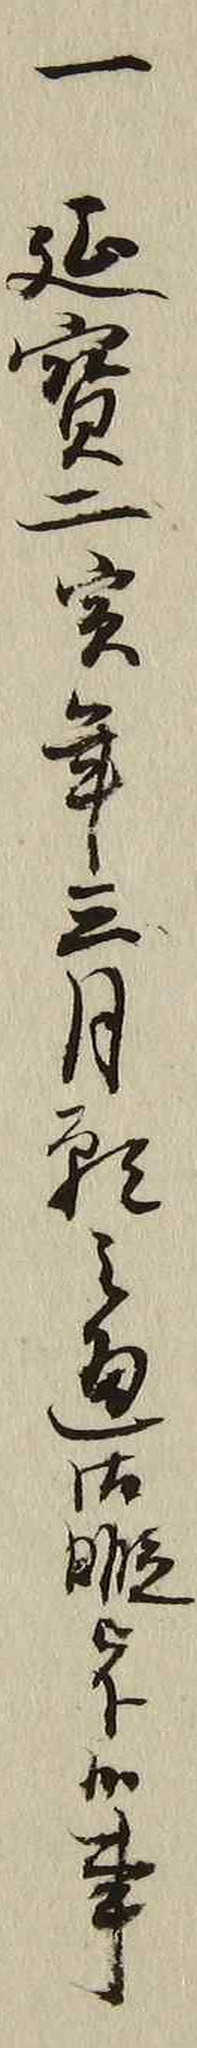一延宝二寅年三月願之通御暇被下候事
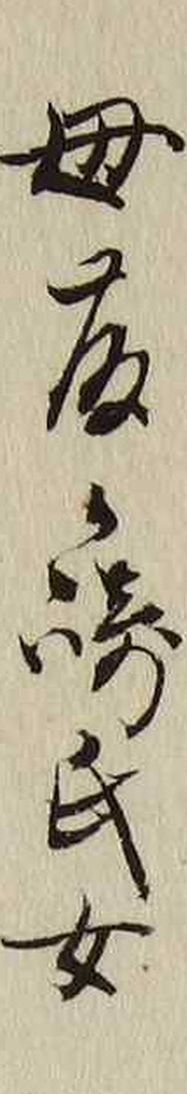母藤ケ崎氏女
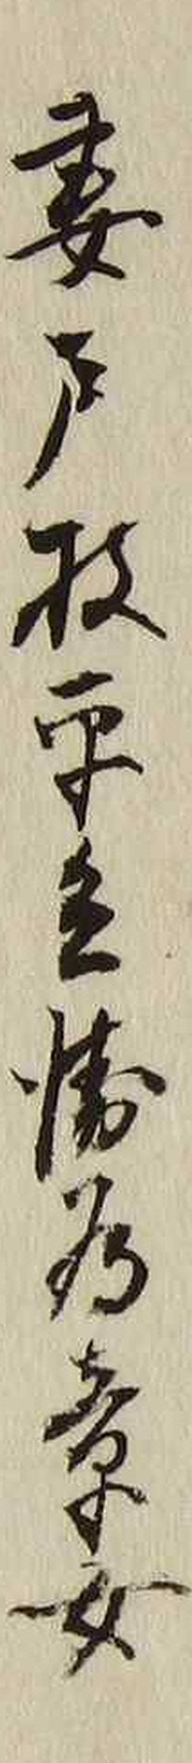妻戸枝平兵衛為章女
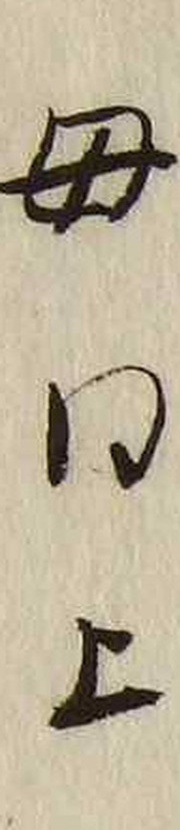母同上

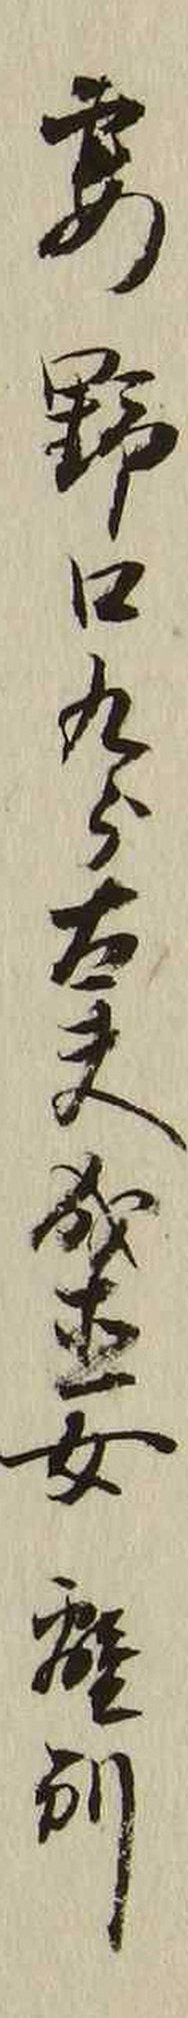妻野口九郎太夫成直女離別
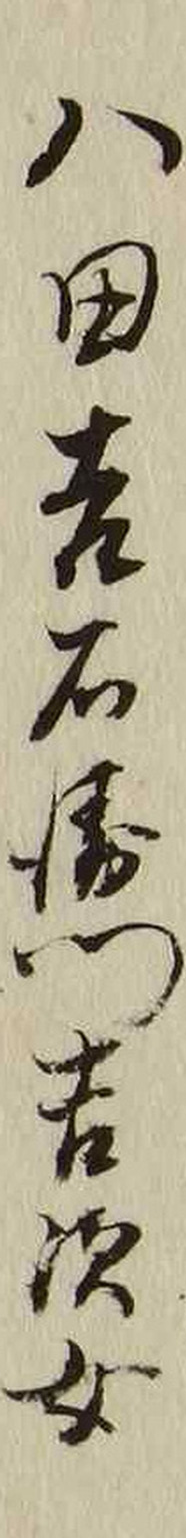八田吉右衛門吉次女
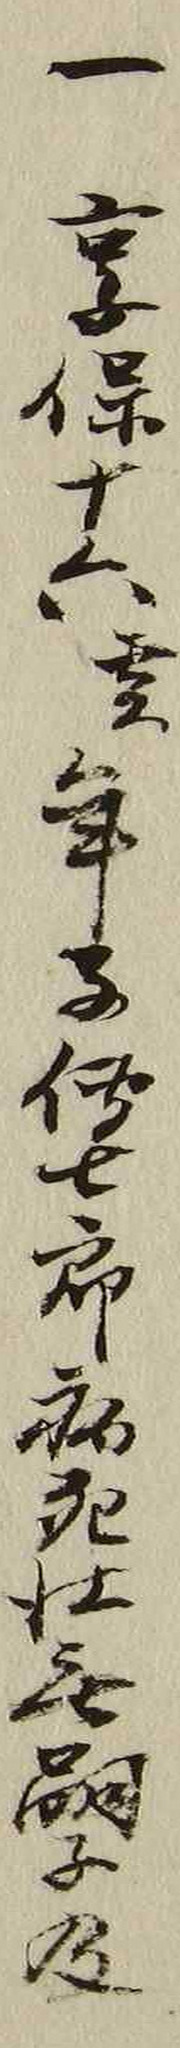一享保十六亥年子伝七郎病死仕無嫡子及
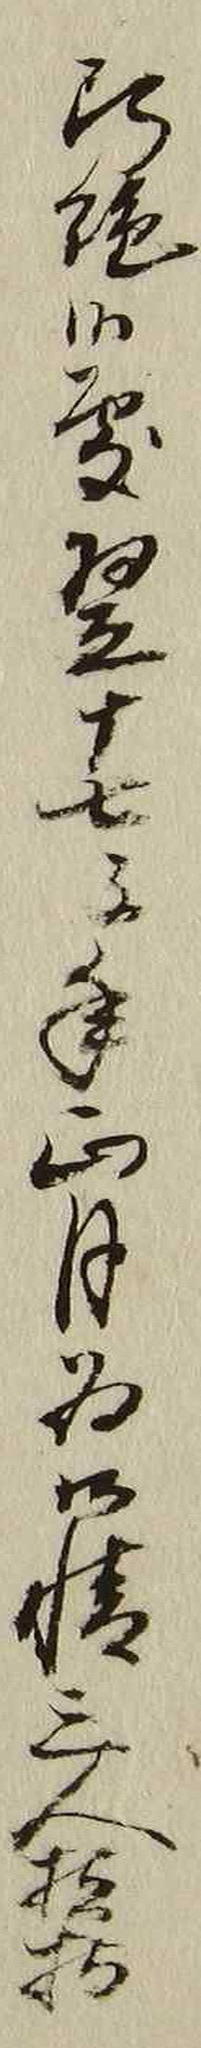断絶候処翌十七子年正月為御情三人扶持
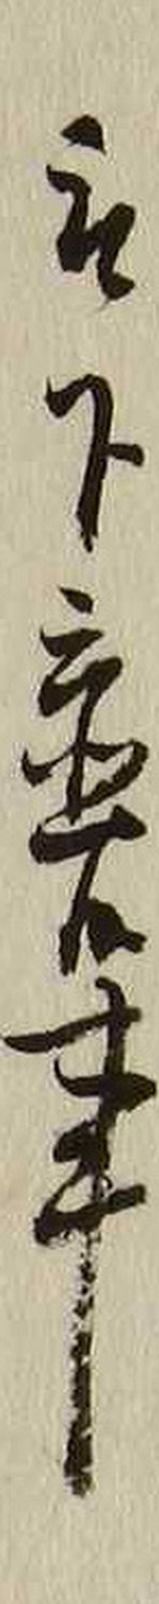被下置候事
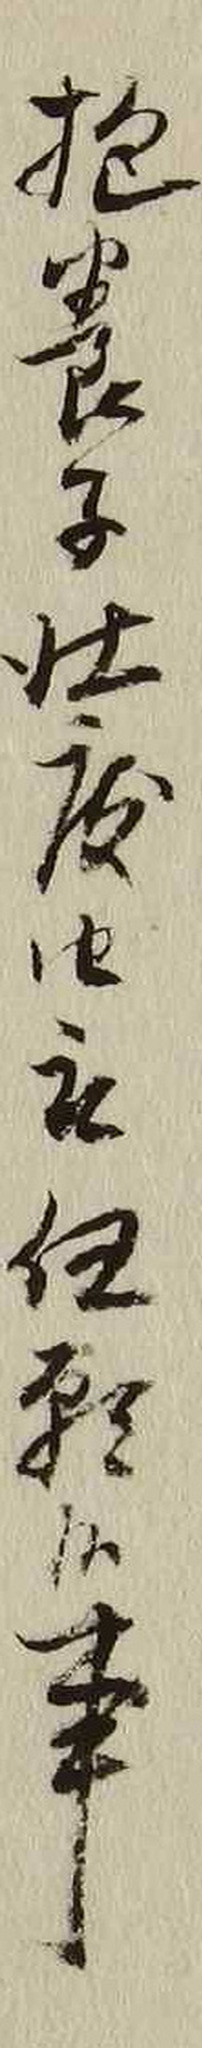抱養子仕度由被任願候事
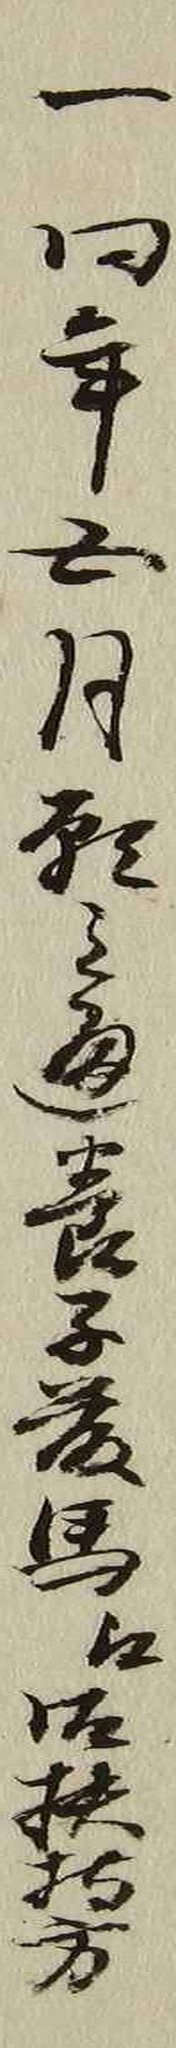一同年五月願之通養子藤馬江御扶持方
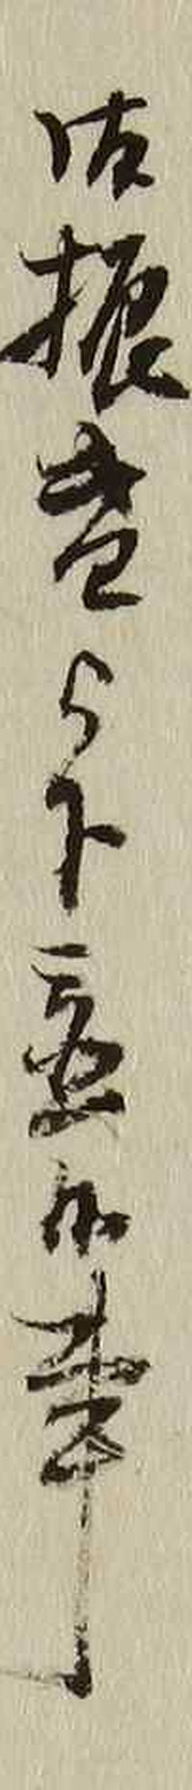御振替被下置候事
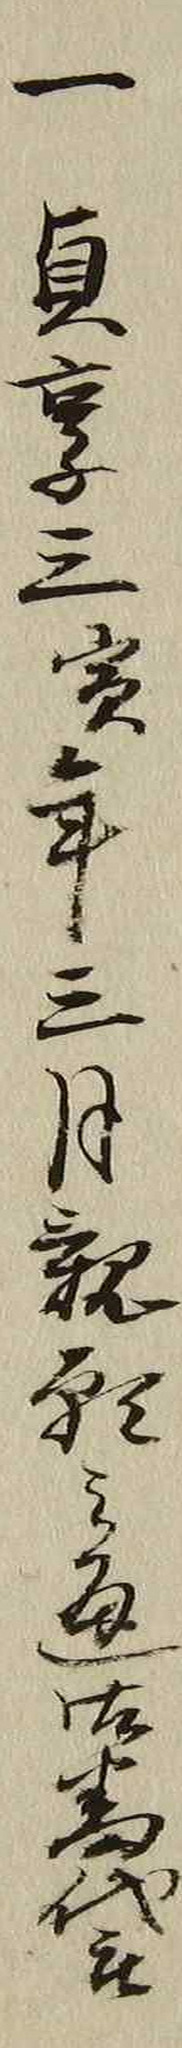一貞享三寅年三月親願之通御番代被
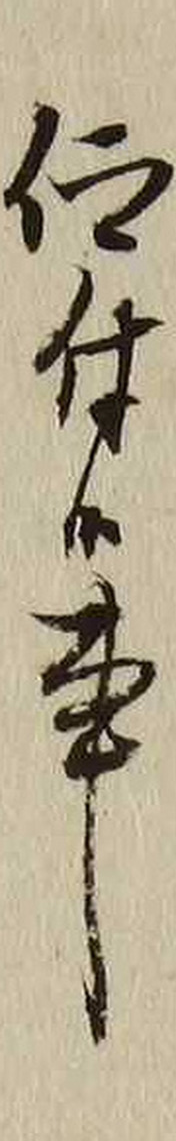仰付候事
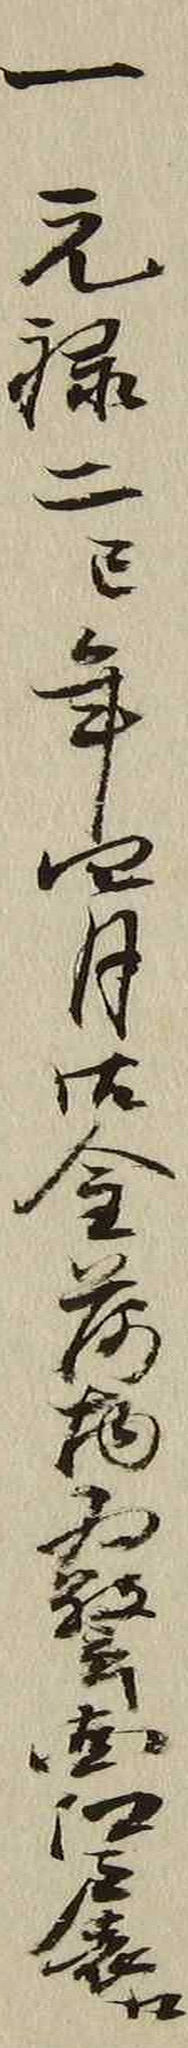一元禄二巳年四月御金荷物為警固江戸表江
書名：諸士系譜　巻之349　も之部5
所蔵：会津若松市立会津図書館
